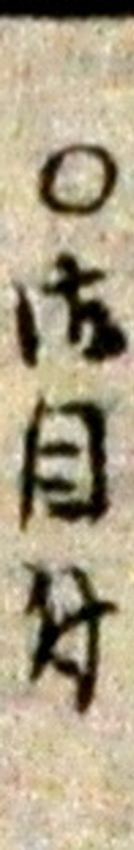○御目付
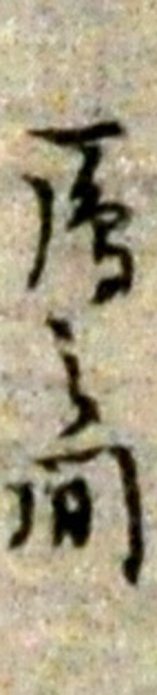雁之間
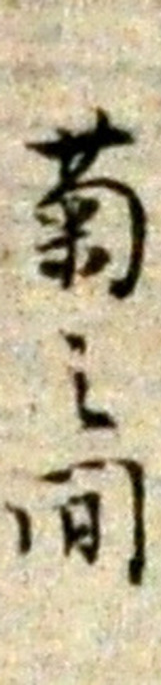菊之間
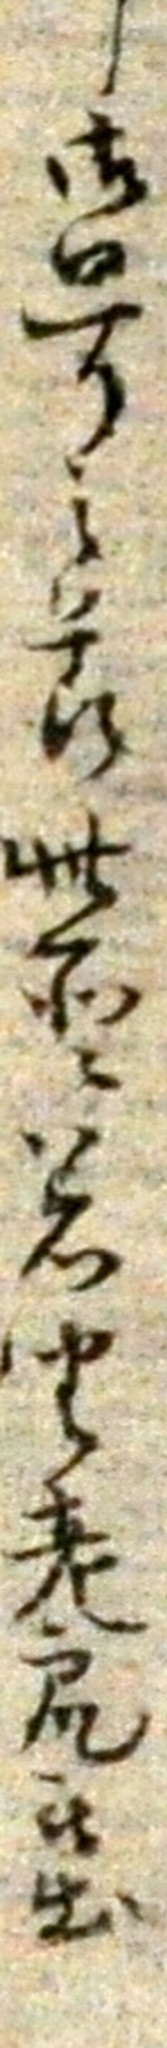御廻り之節此所ニ着坐老衆被出
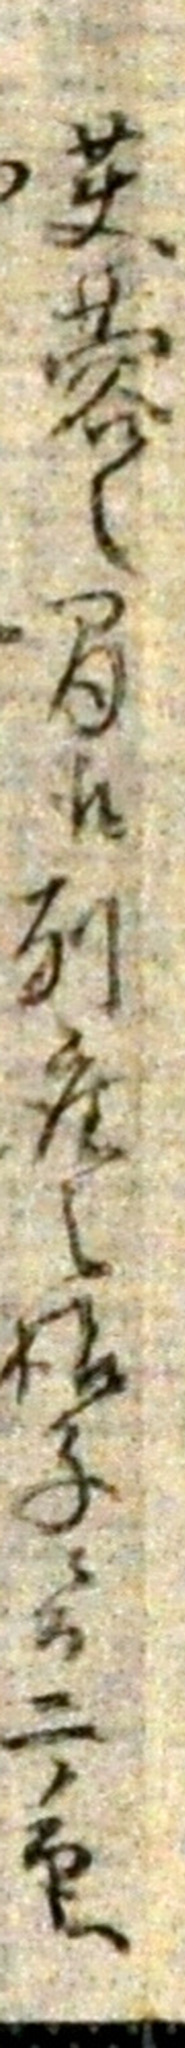芙蓉之間え列座之様子ニ而二ノ印ヘ
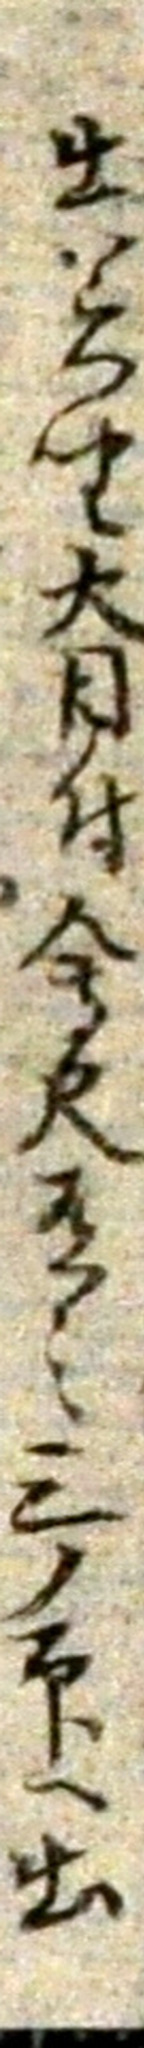出着坐大目付会尺有之三ノ印ヘ出
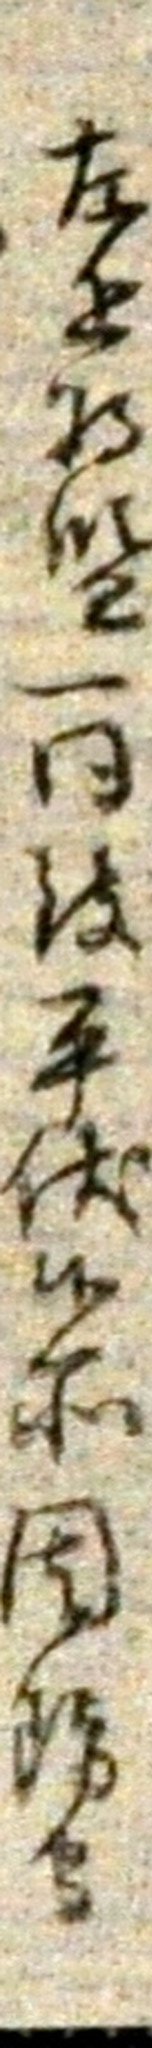左近将監一同致平伏候所周防守
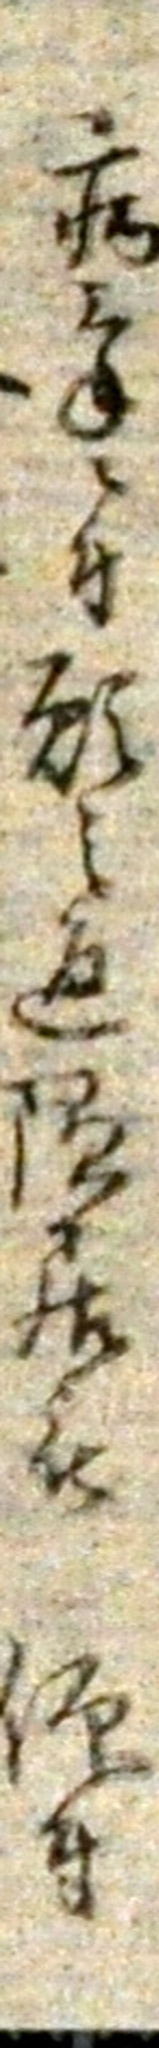病気ニ付願之通隠居被仰付
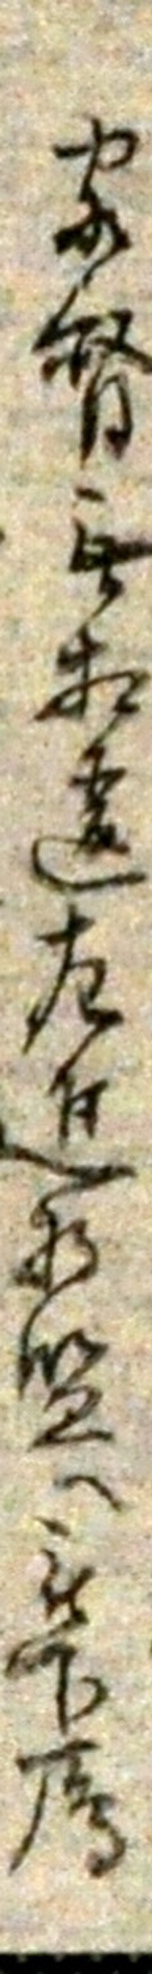家督無相違左近将監ヘ被下雁
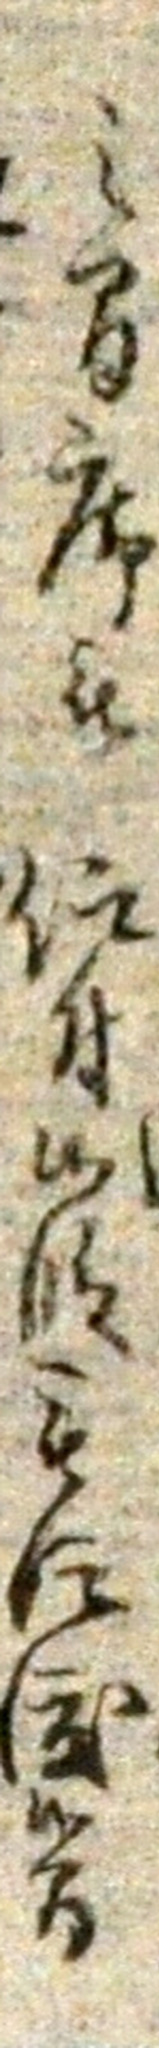之間席被仰付候段被仰渡候間
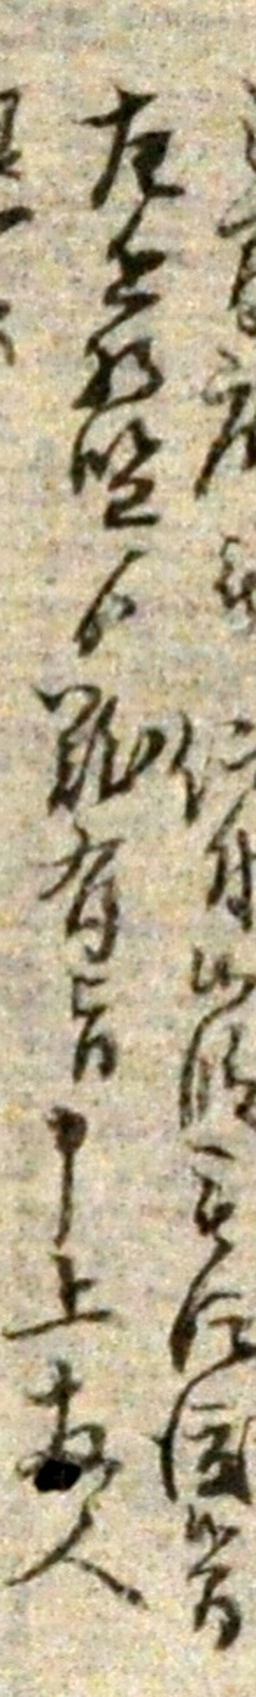左近将監ゟ難有旨申上両人

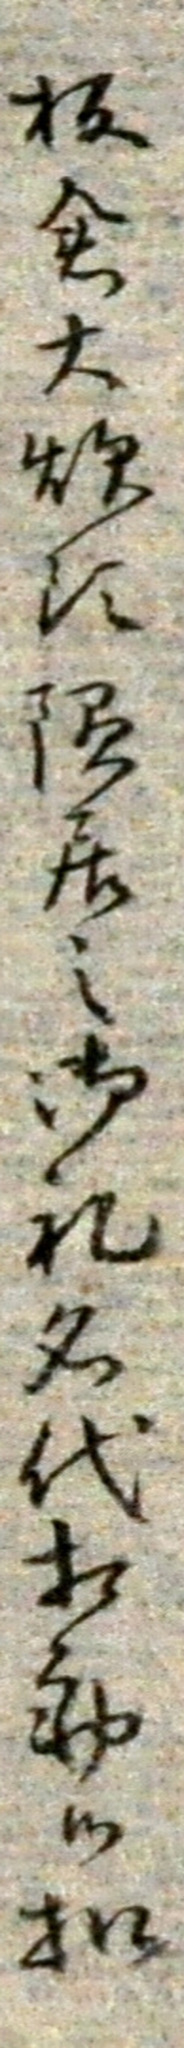板倉大炊頭隠居之御礼名代相勤候扣
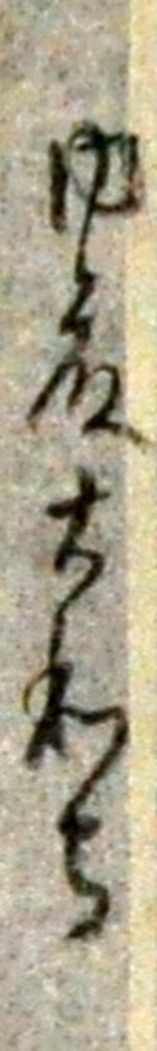内藤大和守
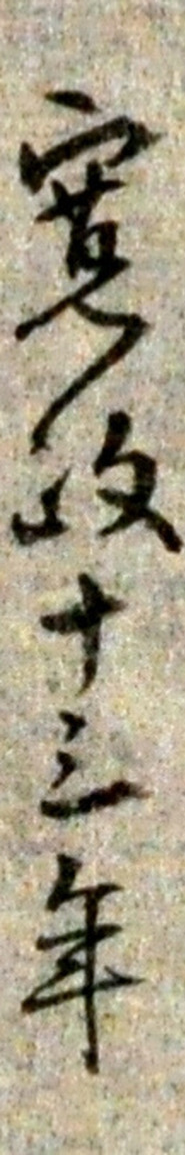寛政十三年
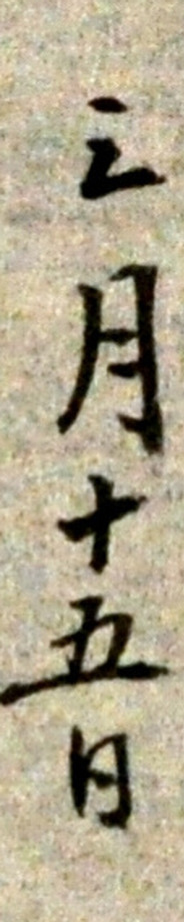三月十五日
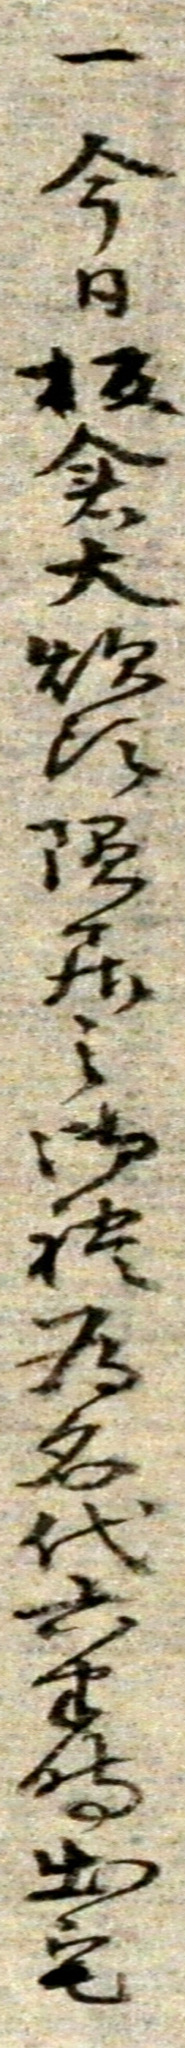一今日板倉大炊頭隠居之御礼為名代六半時出宅
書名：諸名代相勤候節ノ留書外
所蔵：伊那市立高遠町図書館・合同会社AMANE
